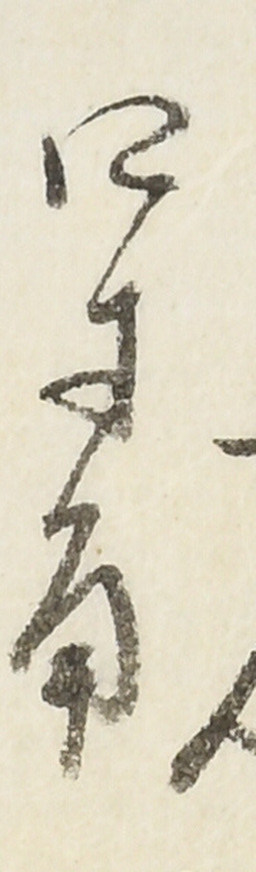四寸角
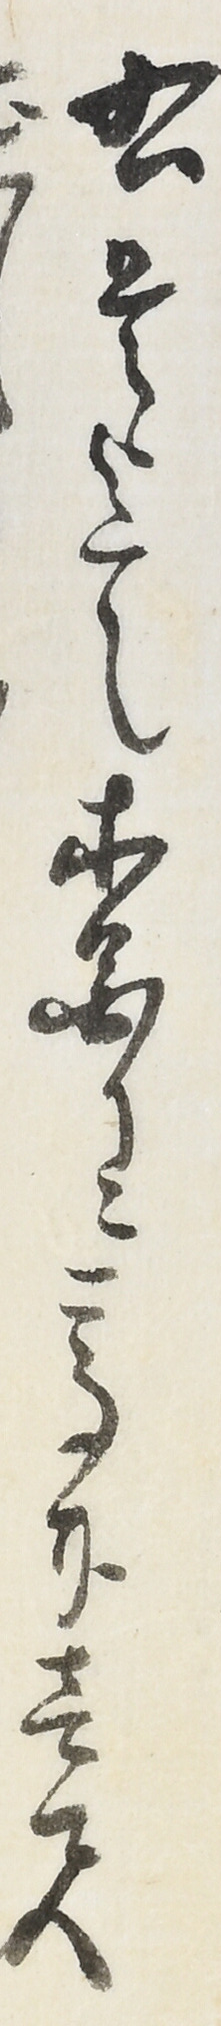右是迄之木図りニ高サ壱尺
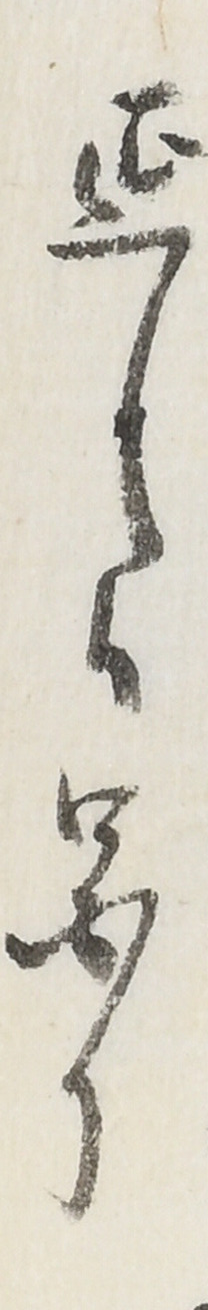延し候図り

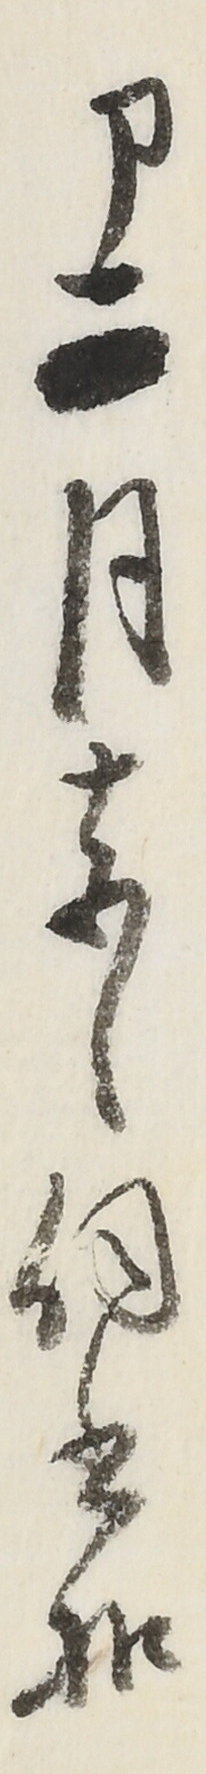申二月十五日伺書控
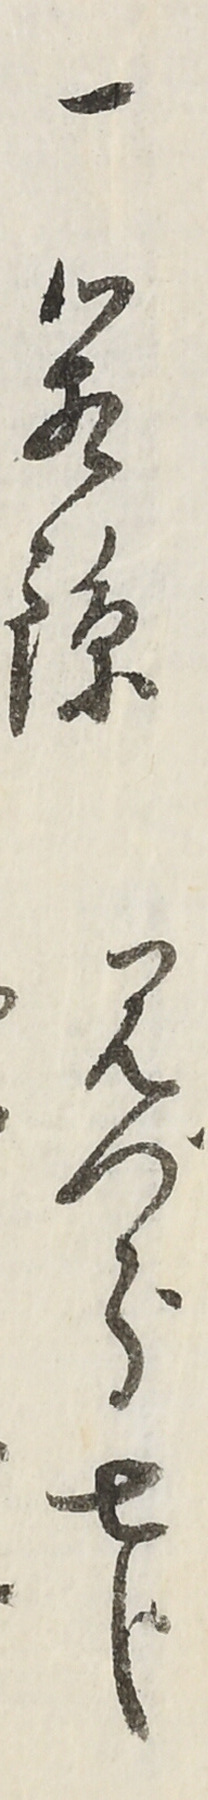一箱銯見づら七分
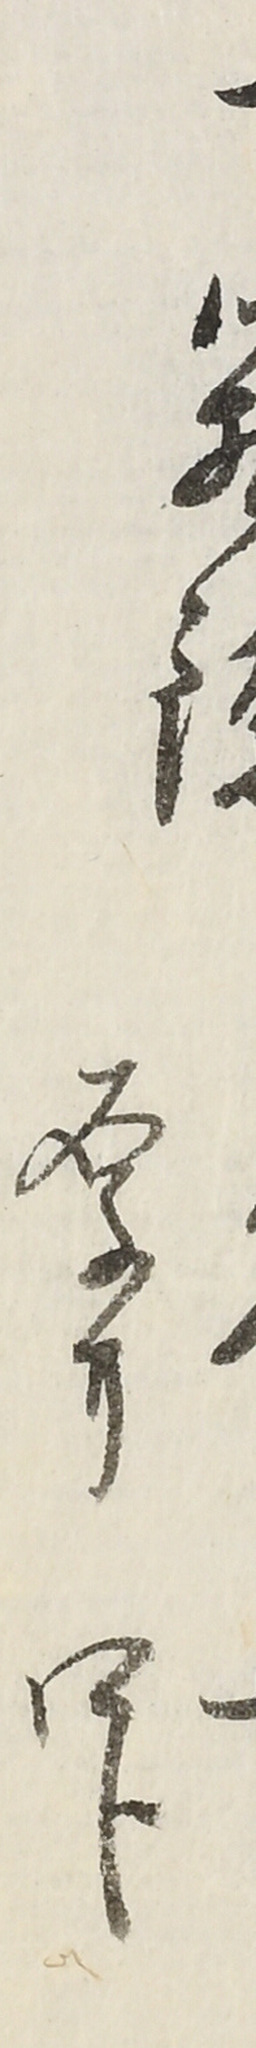厚サ四分
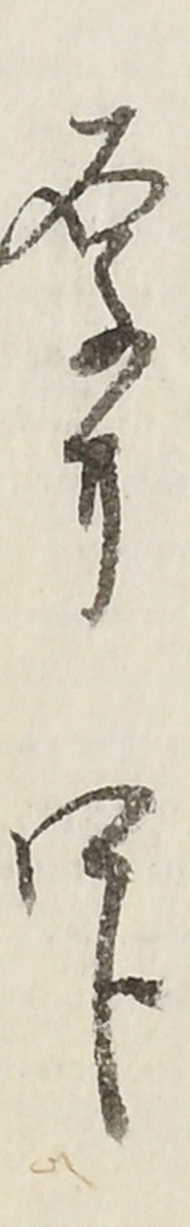厚サ四分
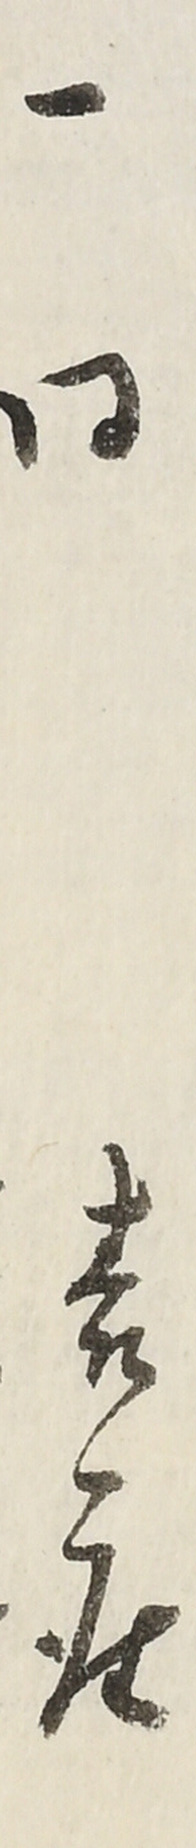一同表座
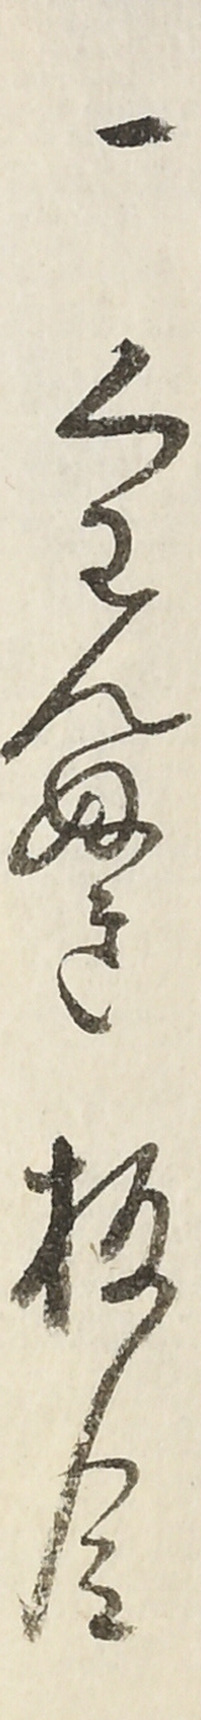一くわんぬき板金
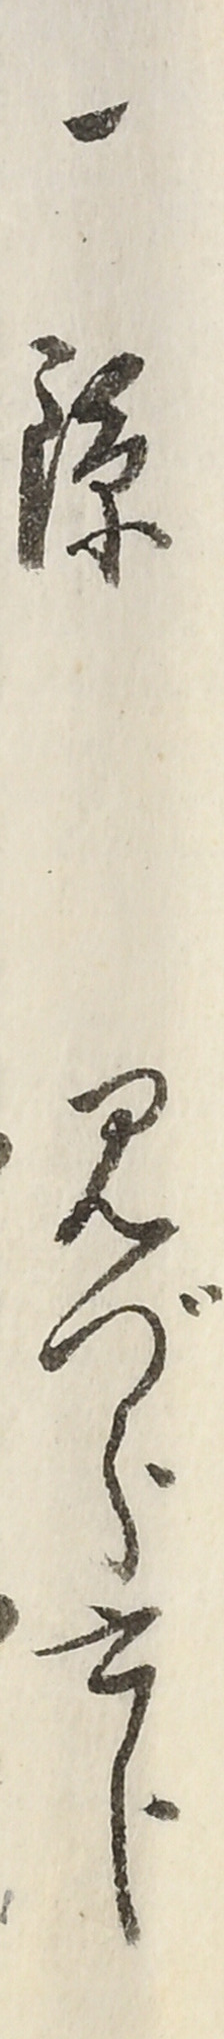一銯見づら六分
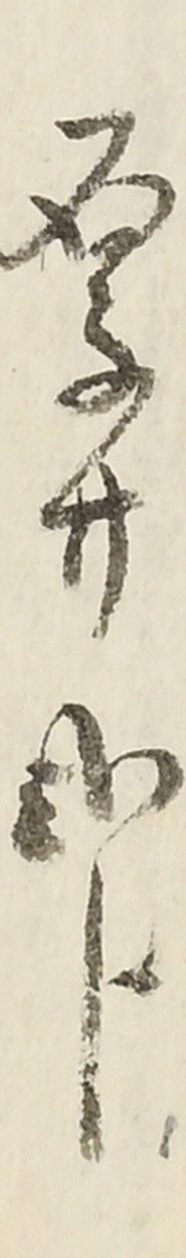厚サ弐分
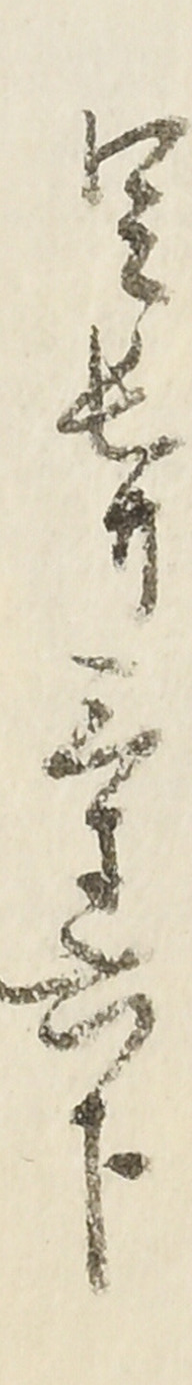足長サ三寸六分
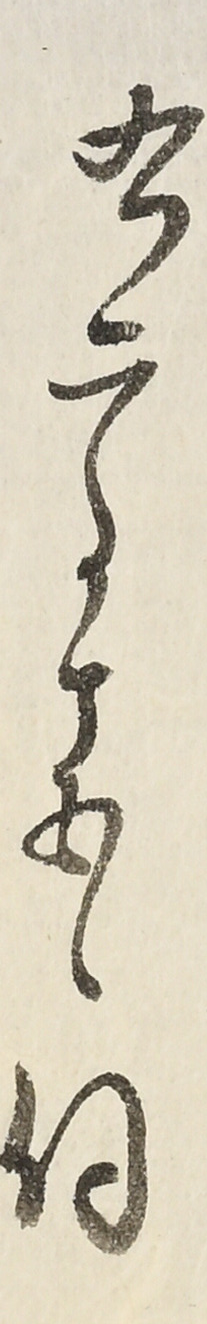右二月十五日伺
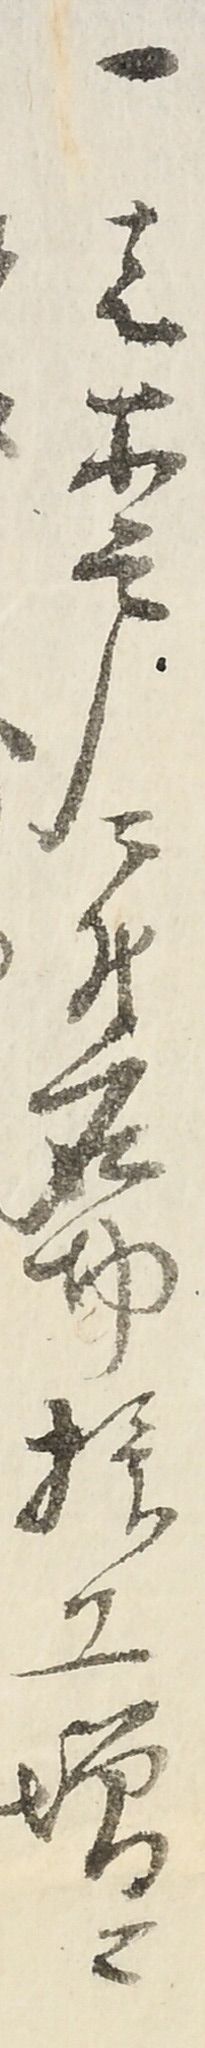一表木戸ニ付石切拾工増ニ
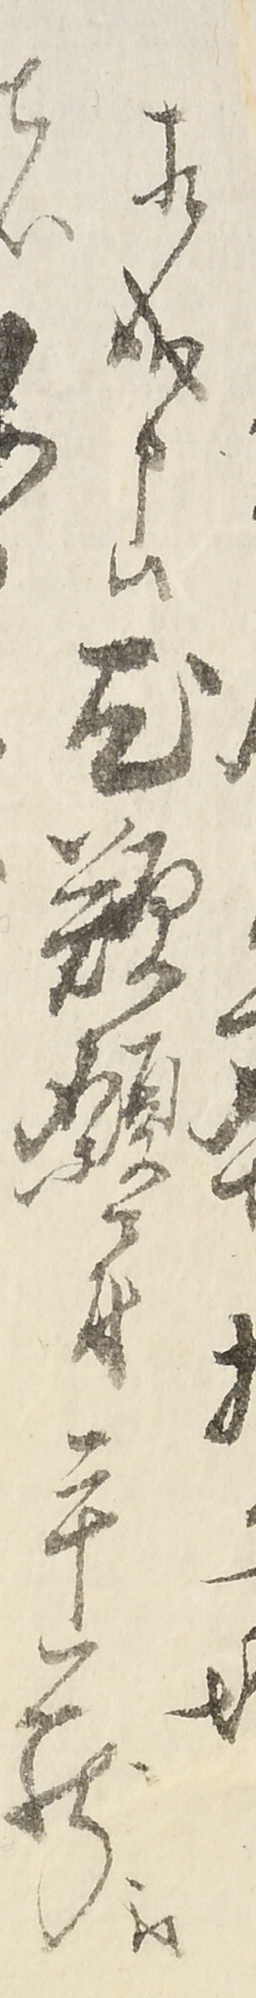相成申候尤歎願ニ付平蔵エ
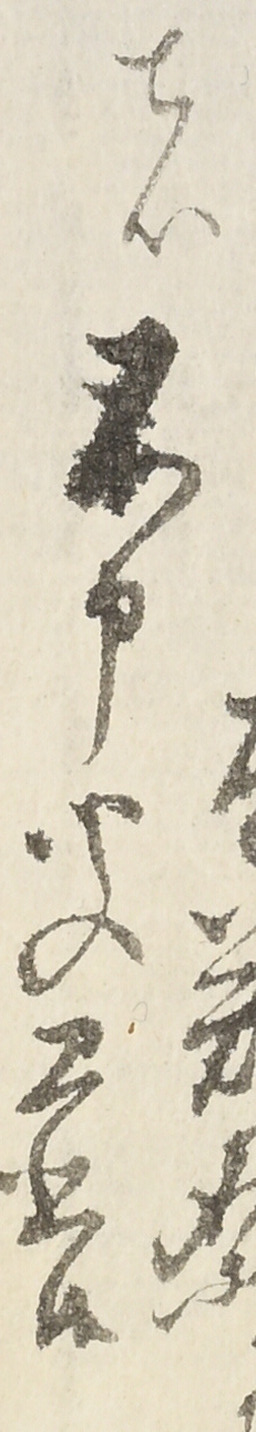者不申聞置候
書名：町方木戸御普請諸事附（一括）
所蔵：伊那市立高遠町図書館・合同会社AMANE
